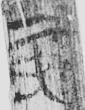耳
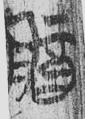𨟻（將）
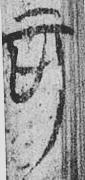可（何）
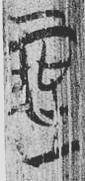聖（聽）
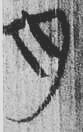月
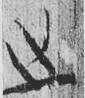之
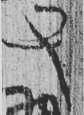又（有）
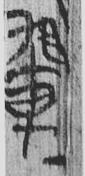軍
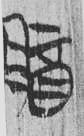𨟻（將）
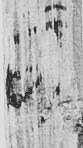可（何）
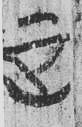正
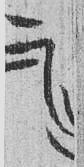水
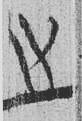之
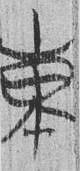東
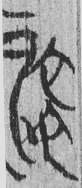流
